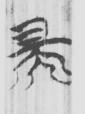耑
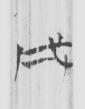戌
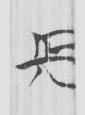長
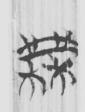無
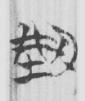型
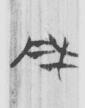凡
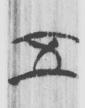五
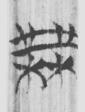無
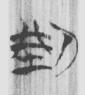型
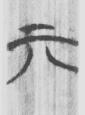亓
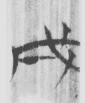戌
